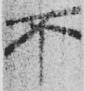不
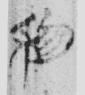利
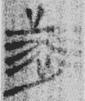涉
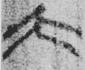大
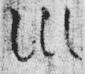川
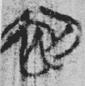初
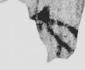六
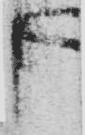不
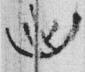出
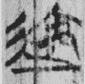○（御）
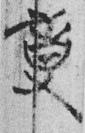事
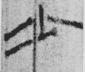少（小）
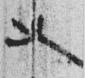又（有）
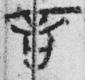言
